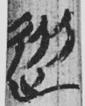從
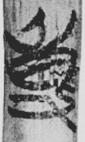事
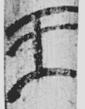王
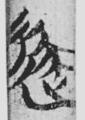○（徙）
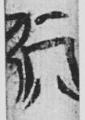凥（處）
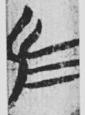於
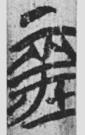坪（平）
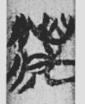澫（厲）
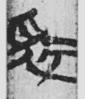○（卒）
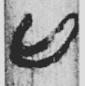㠯
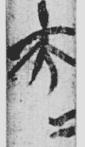大夫
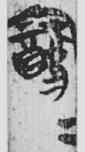㱃酒
